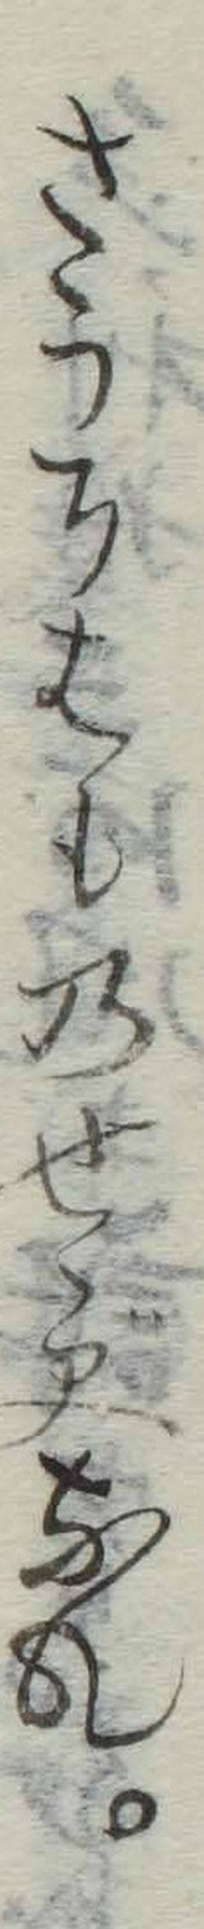さうにはものせずなれ。
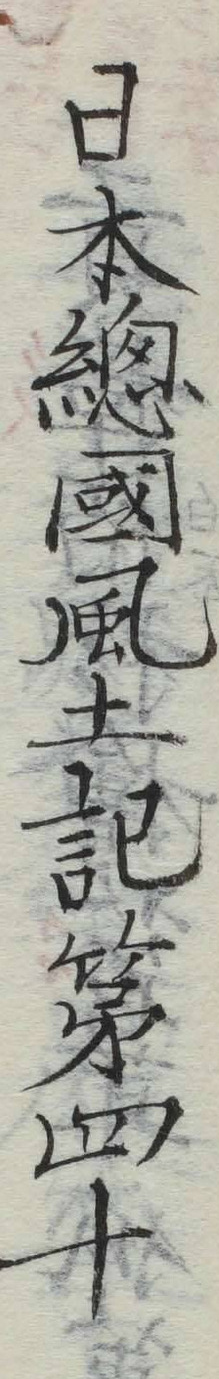日本総国風土記第四十
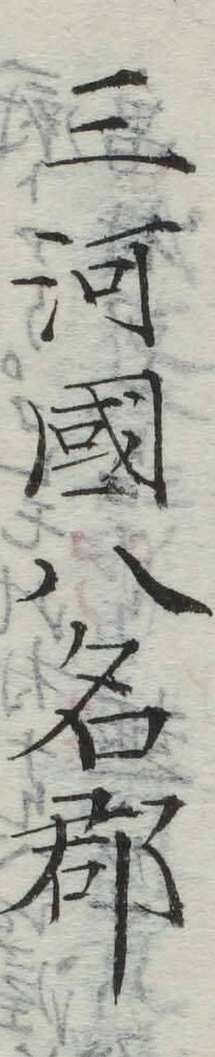三河国八名郡

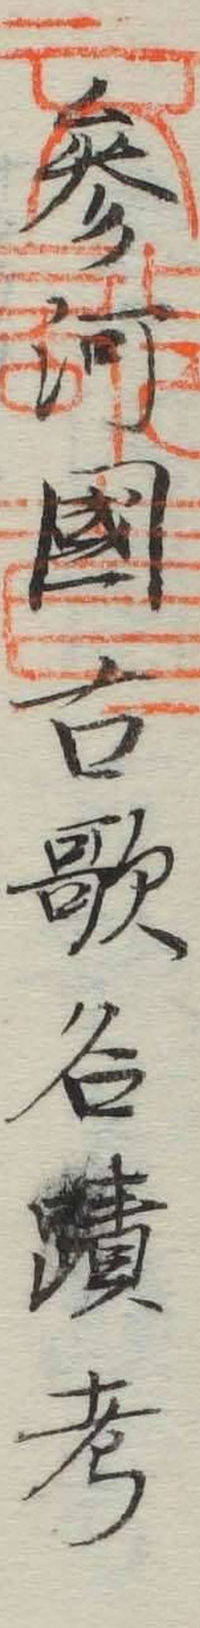参河国古歌名蹟考
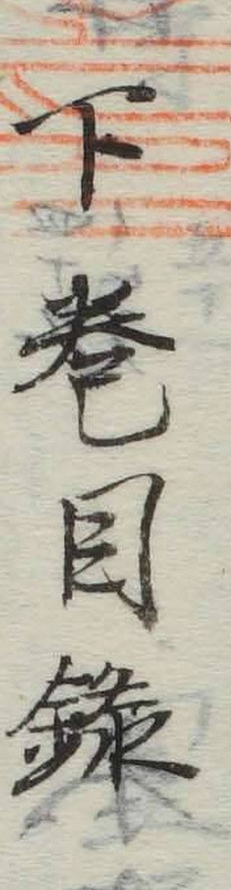下巻目録
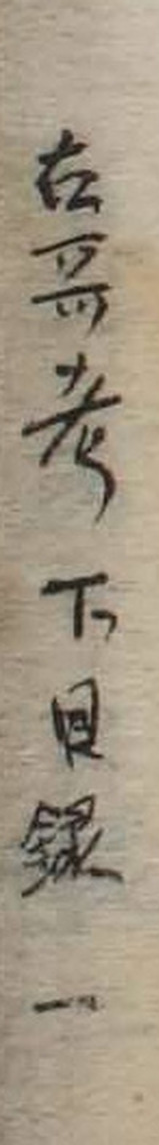古歌考下目録一

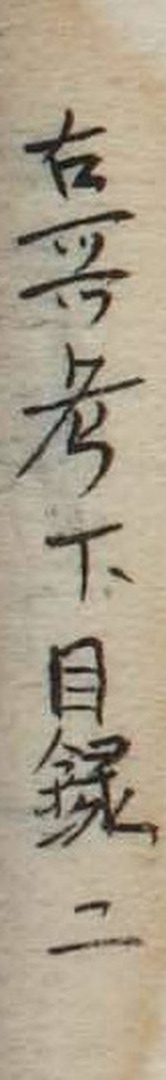古歌考下目録二

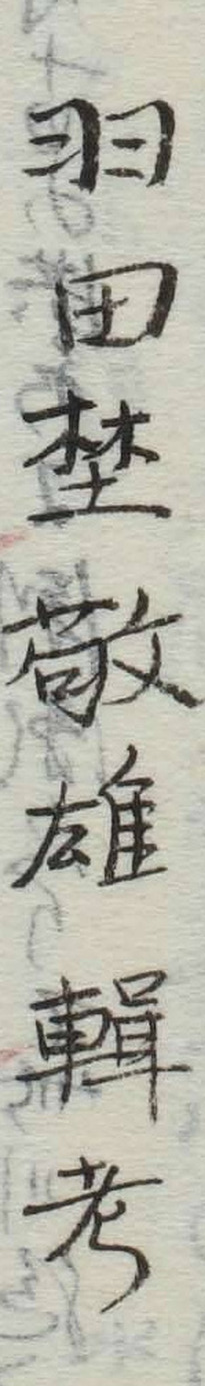羽田埜敬雄輯考
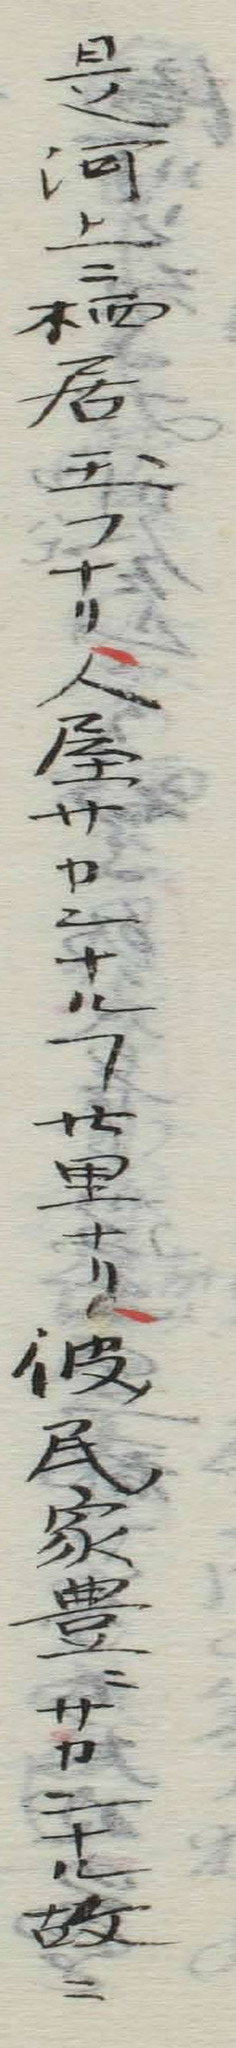是河上ニ栖居玉フナリ、人屋サカンナルコト廿里ナリ、彼民家豊ニサカンナル故ニ
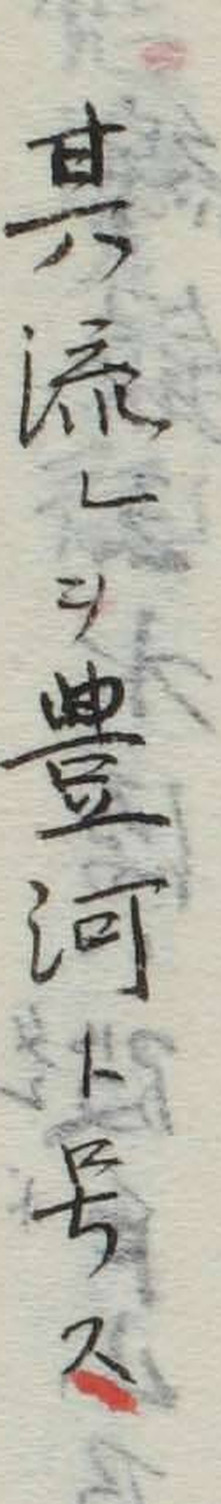其流レヲ豊河ト号ス、
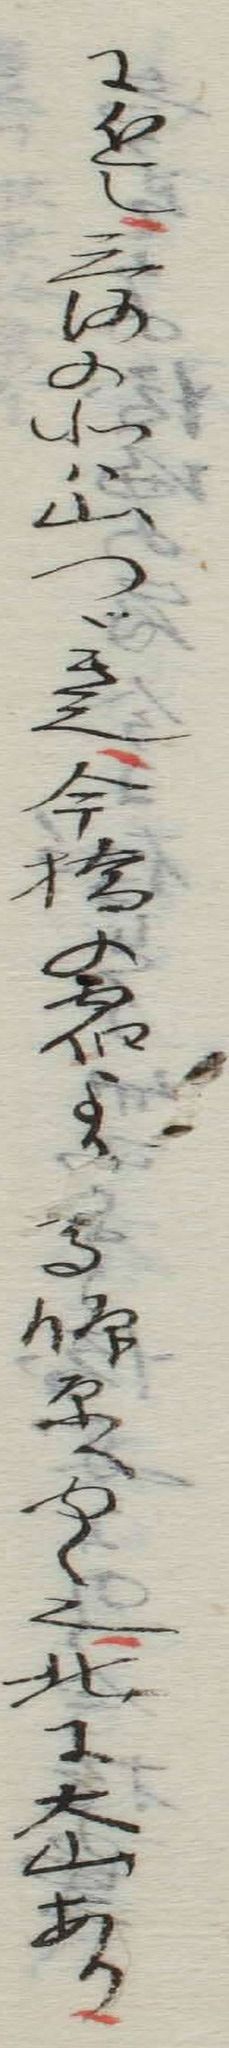に近し、三河の北は山つゞき也、今橋の宿より高師原へゆく也、北に大山あり、

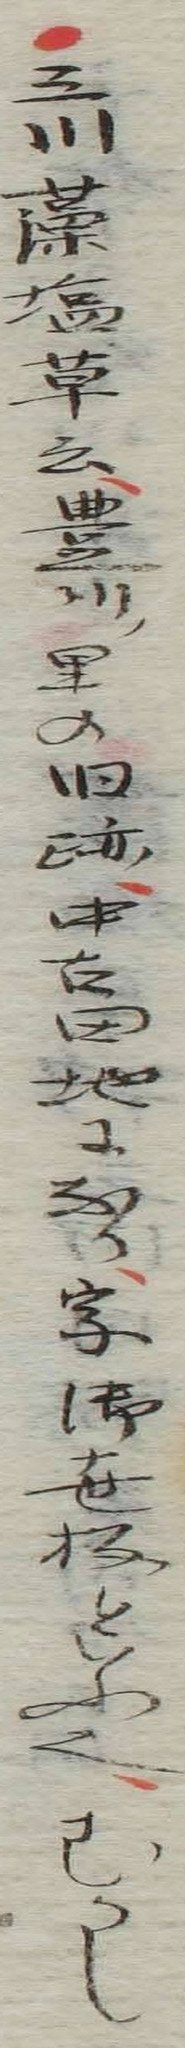●三川藻塩草云、豊川ノ里の旧跡、中古田地になり、字御世板といふ也、むかし
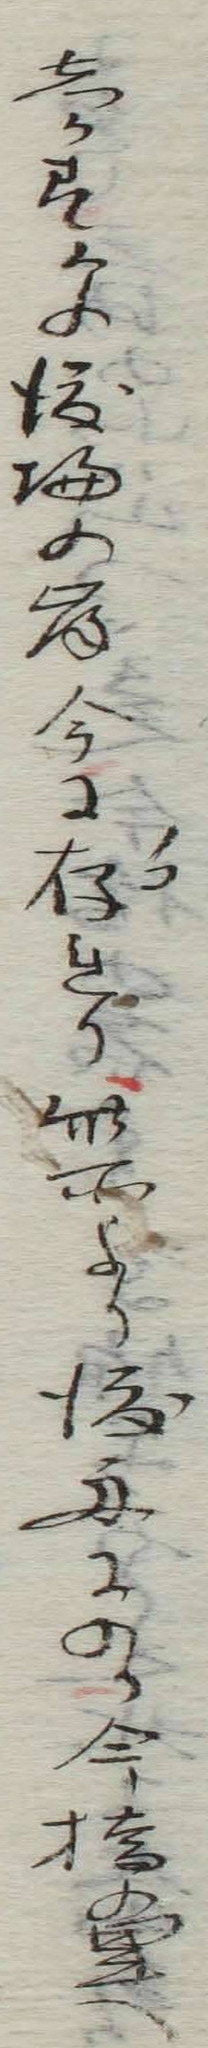しかすかの渡場の岸今に存れり、此所より渡舟にのり今橋の里へ
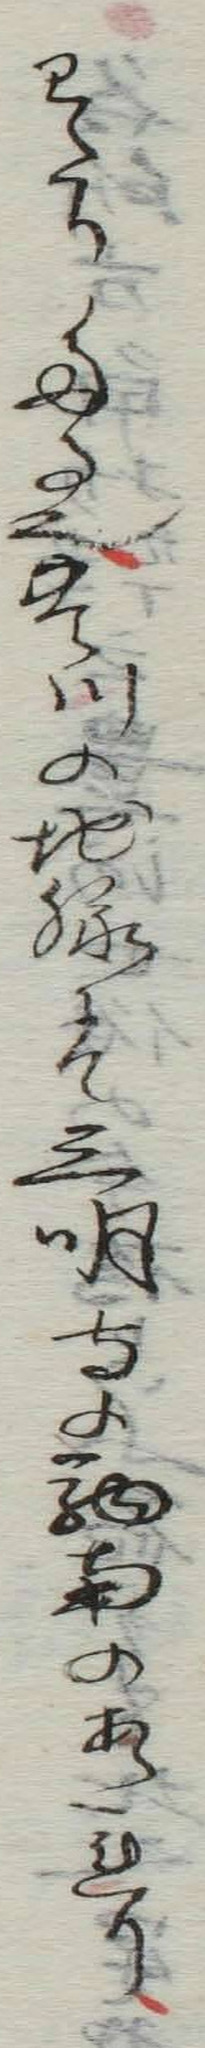わたりたる也、豊川の地縁にて三明寺の西南のあたれり、
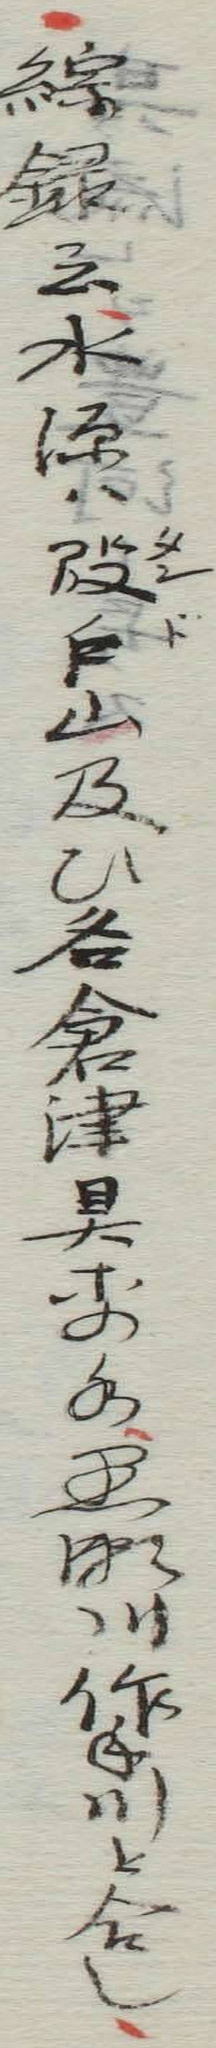●綜録云、水源は段戸山及ひ名倉津具等の水、黒瀬川作手川と合し、
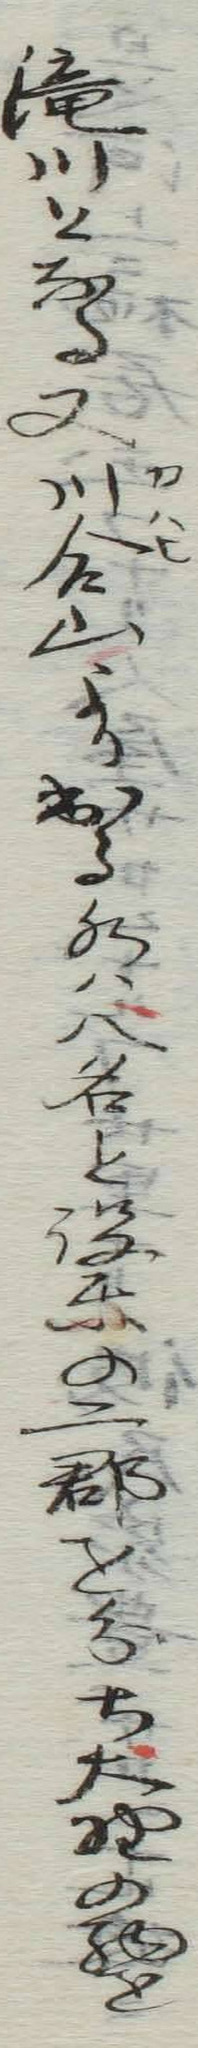滝川となる又川合山より出る水は、八名と設楽の二郡を分ち、大野の西を
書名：三河国古跡考
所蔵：国文学研究資料館
